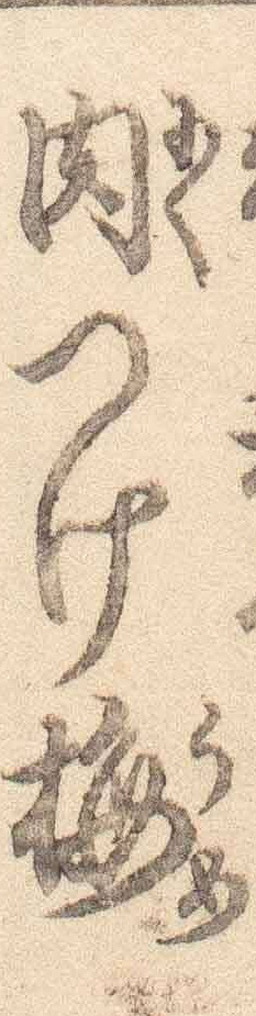肉つけ梅
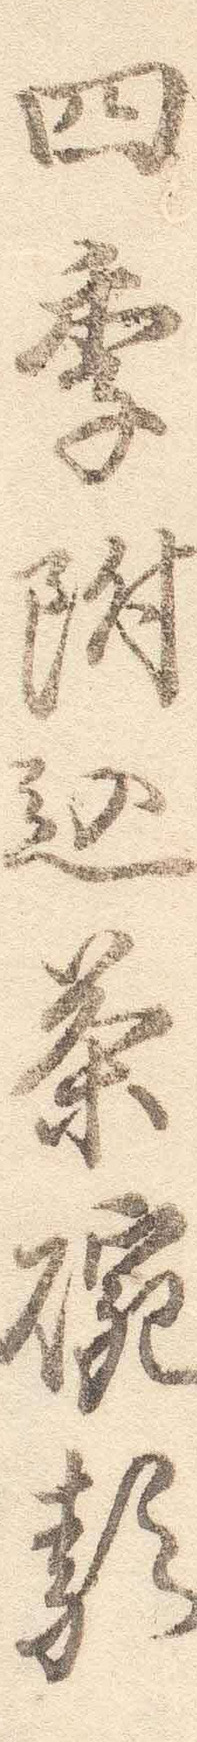四季附込茶碗類
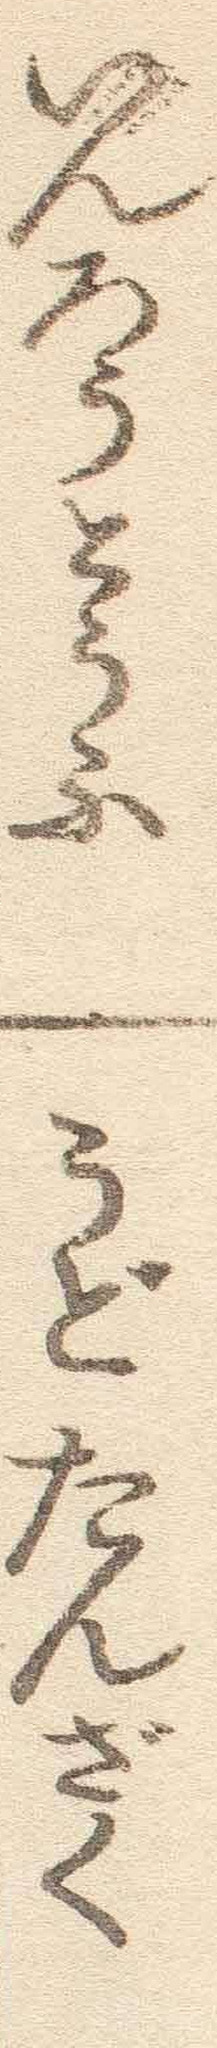いんろうとうふうどたんざく
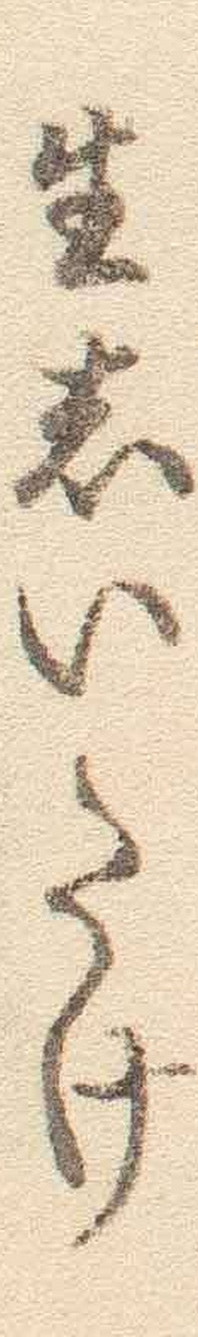生しいたけ
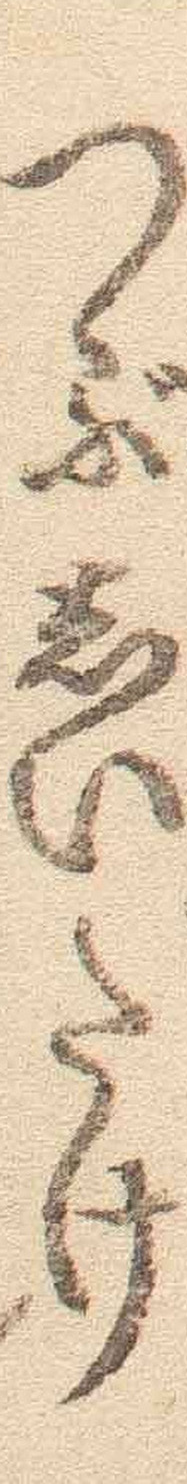生しいたけ
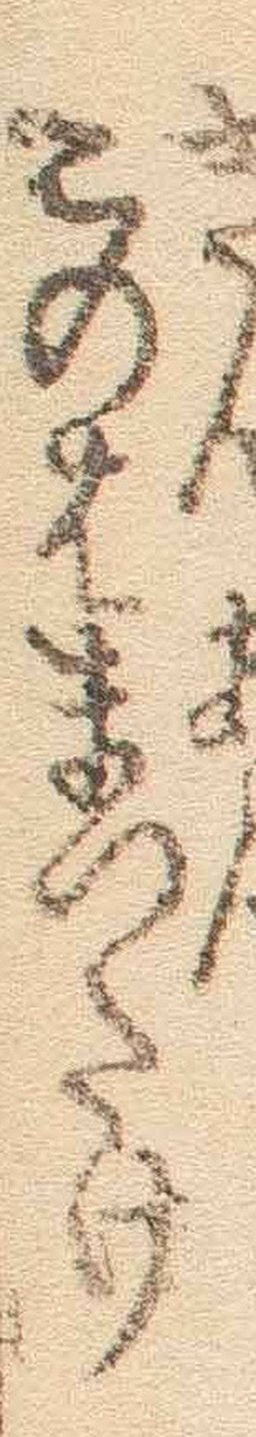このはまつたけ

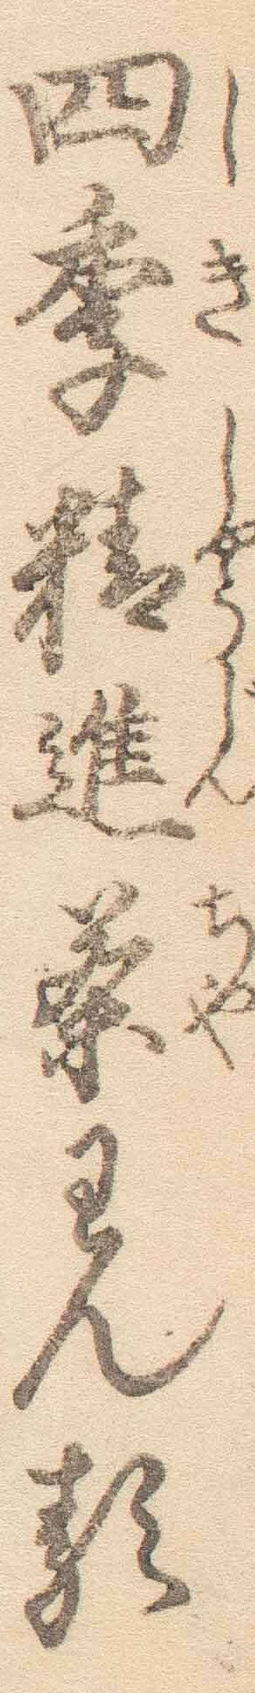四季精進茶わん類
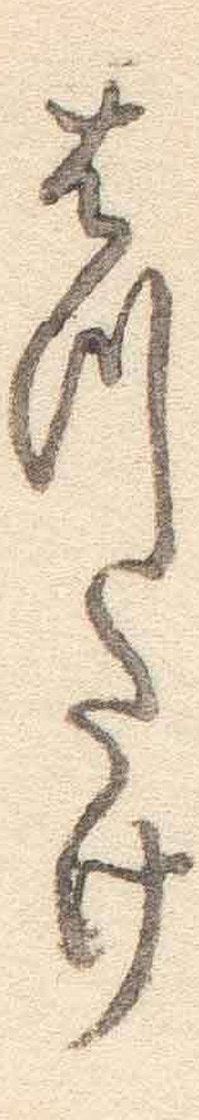まつたけ
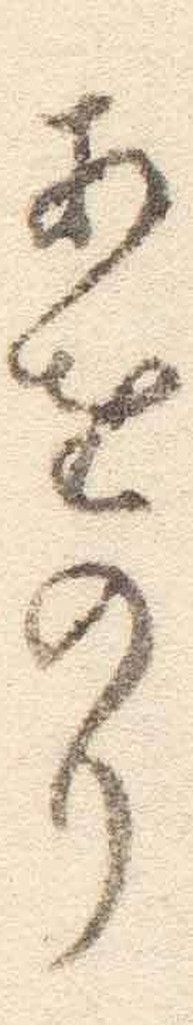あをのり
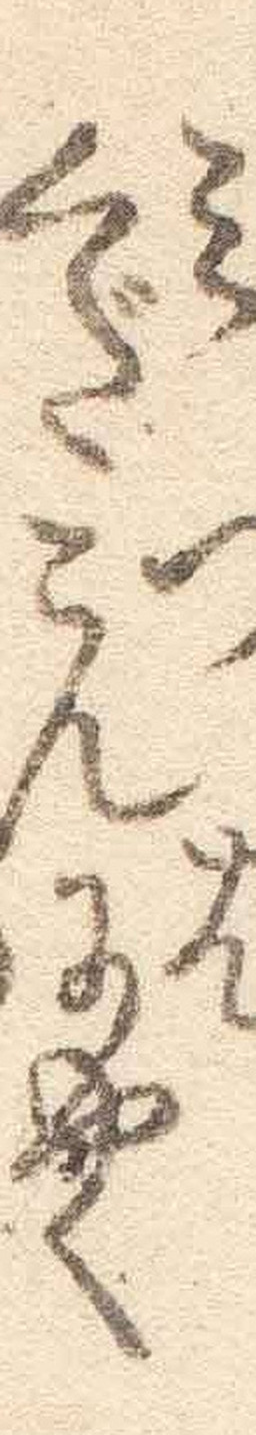くだこんにゃく
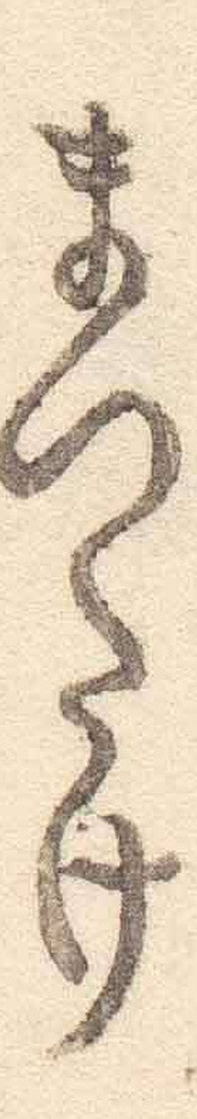まつたけ
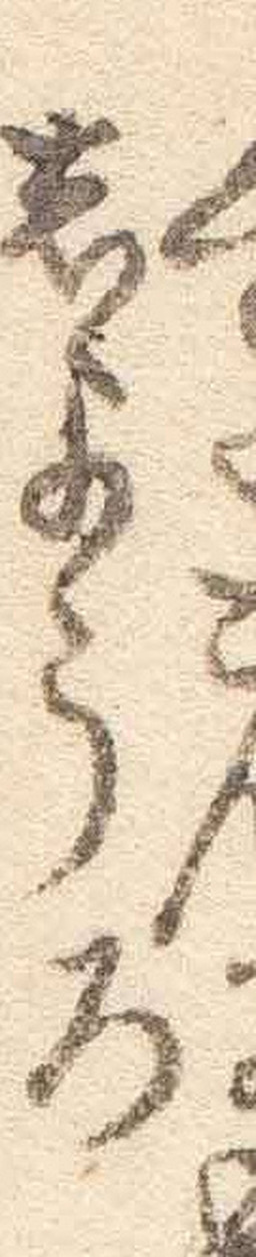しようろ
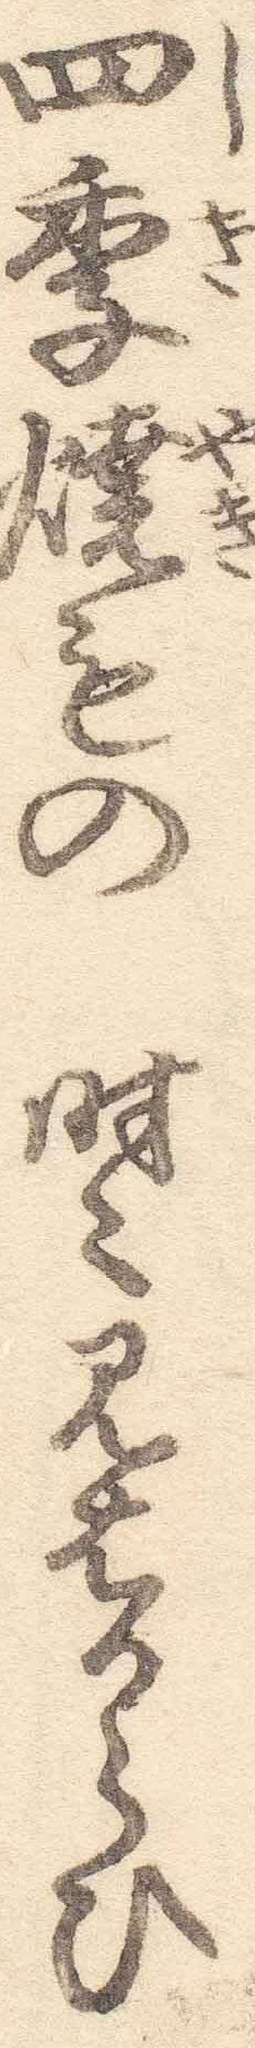四季焼もの時々見はからひ
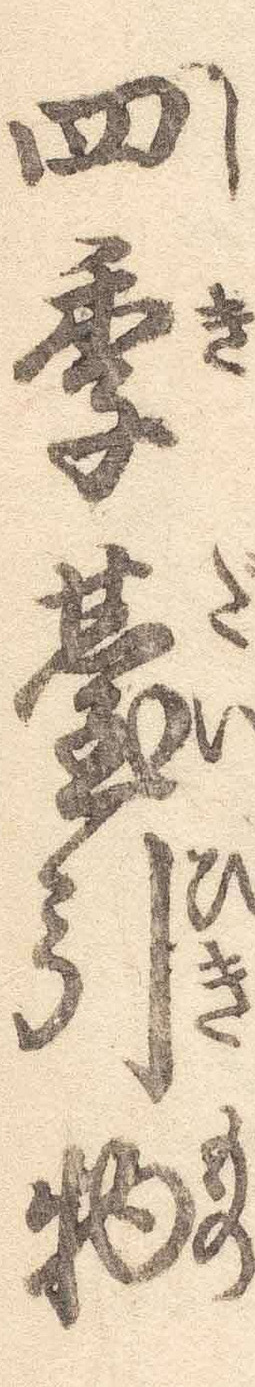四季台引物
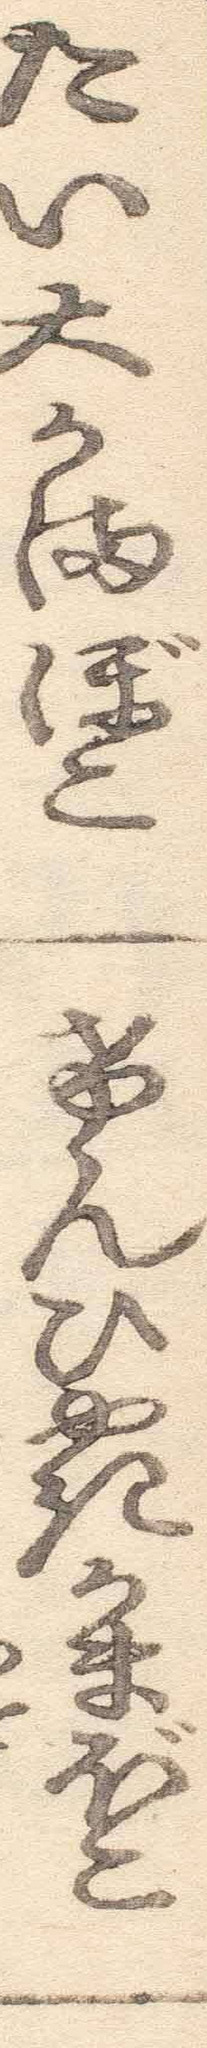たい大かまぼこけんひやきかまぼこ
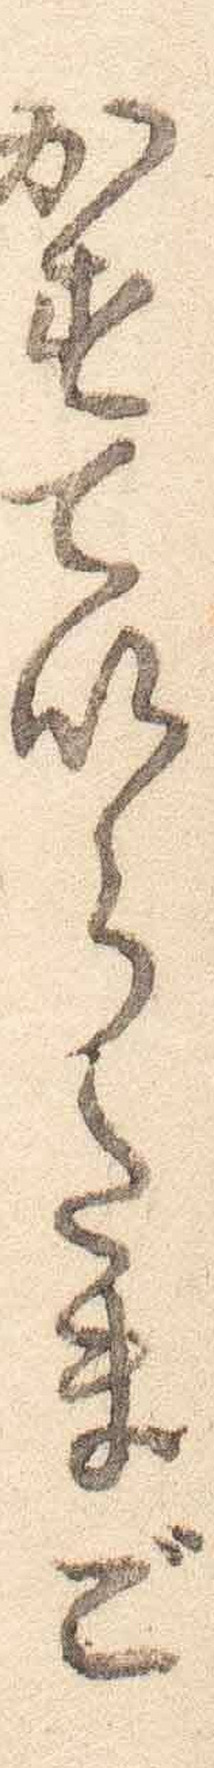かすていらたまご
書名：料理通
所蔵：東京学芸大学附属図書館 国文学研究資料館
